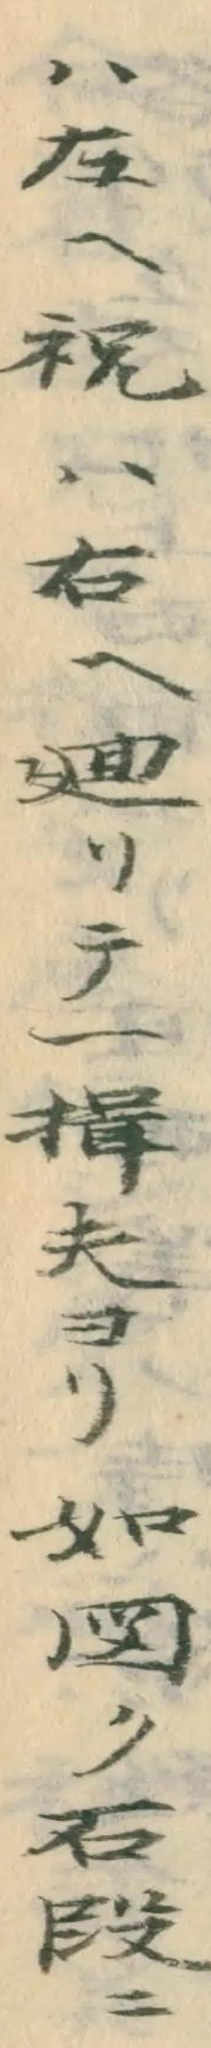ハ左へ祝ハ右ヘ廻リテ一揖夫ヨリ如図ク石段ニ

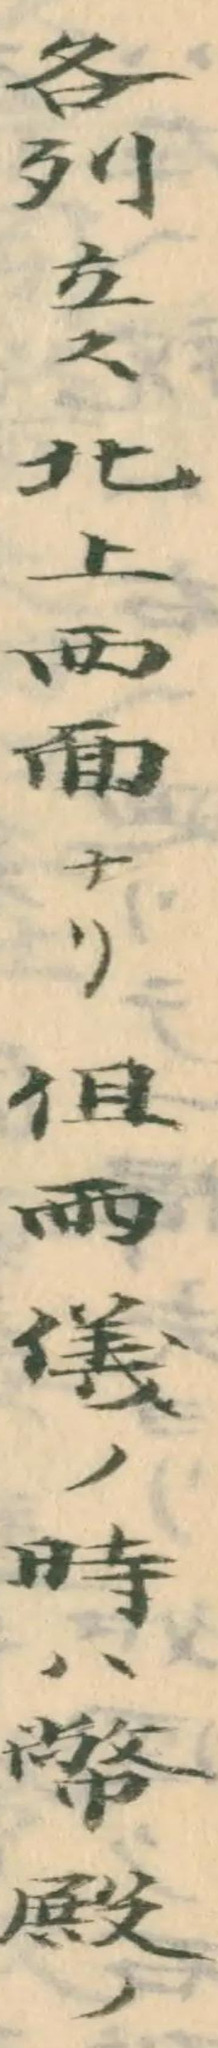各列立ス北上西面ナリ但雨儀ノ時ハ幣殿ノ
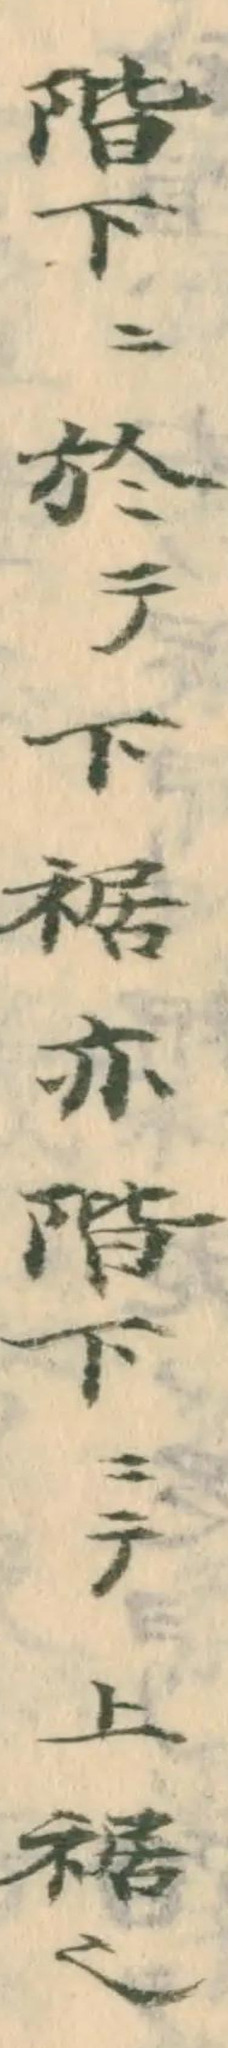階下ニ於テ下裾亦階下ニテ上裾也
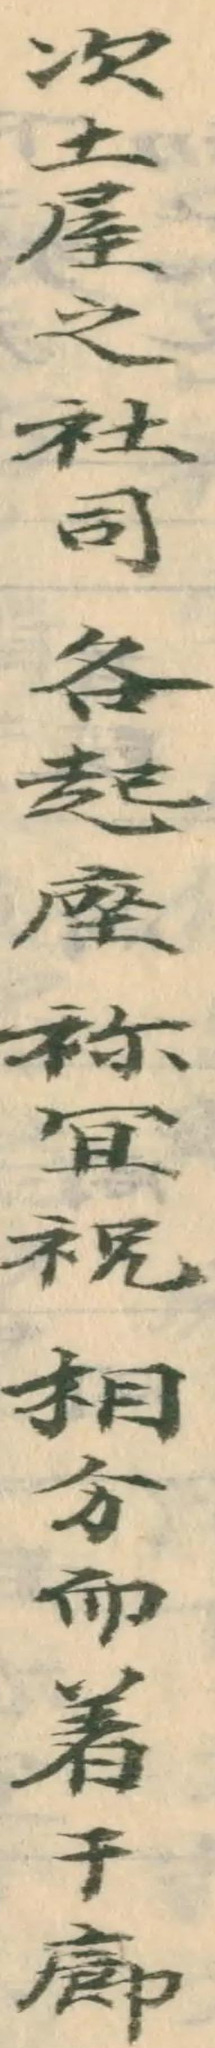次土屋之社司各起座禰宜祝相分而着于廊
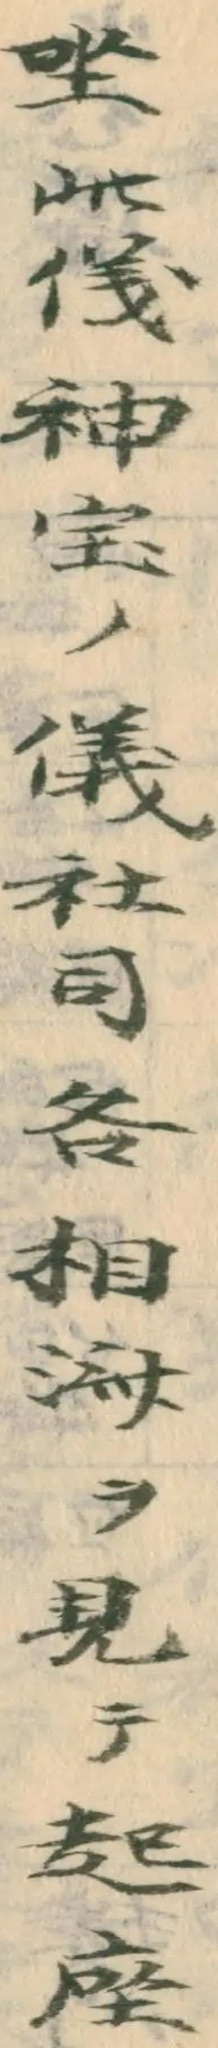坐此儀神宝ノ儀社司各相済ヲ見テ起座
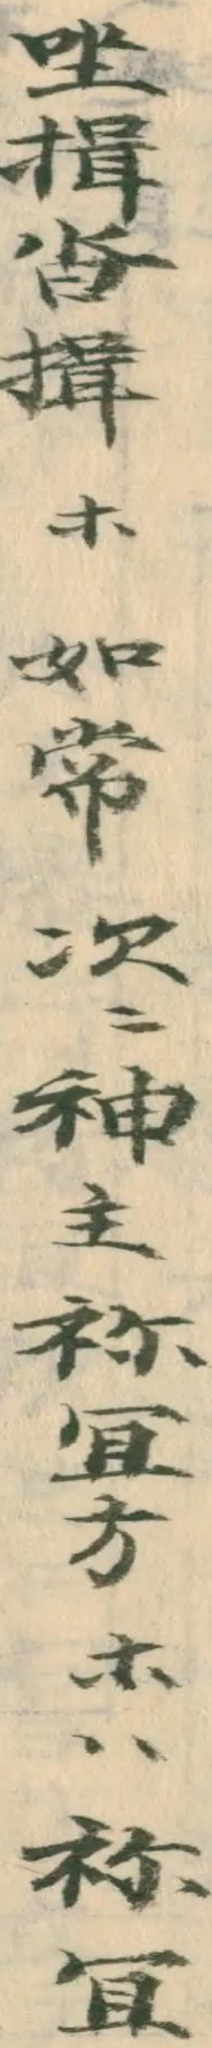坐揖沓揖等如常次ニ神主禰宜方等ハ禰宜
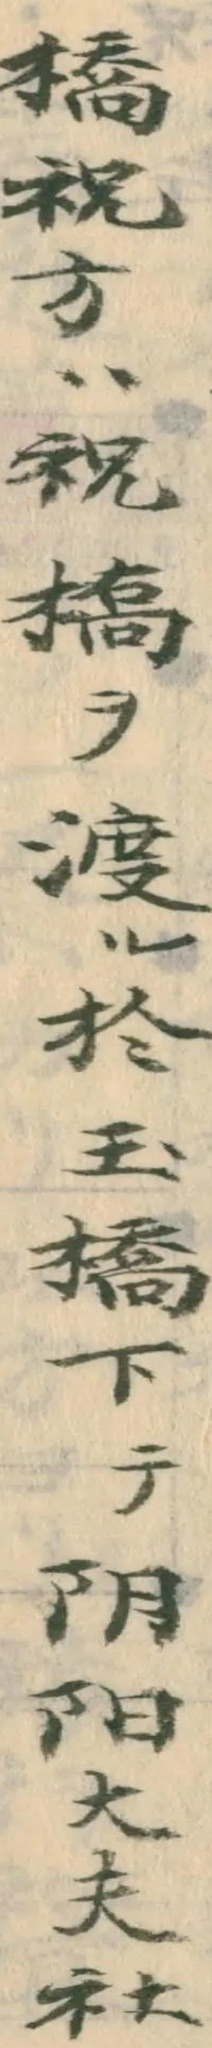橋祝方ハ祝橋ヲ渡ル於玉橋下テ陰陽大夫社
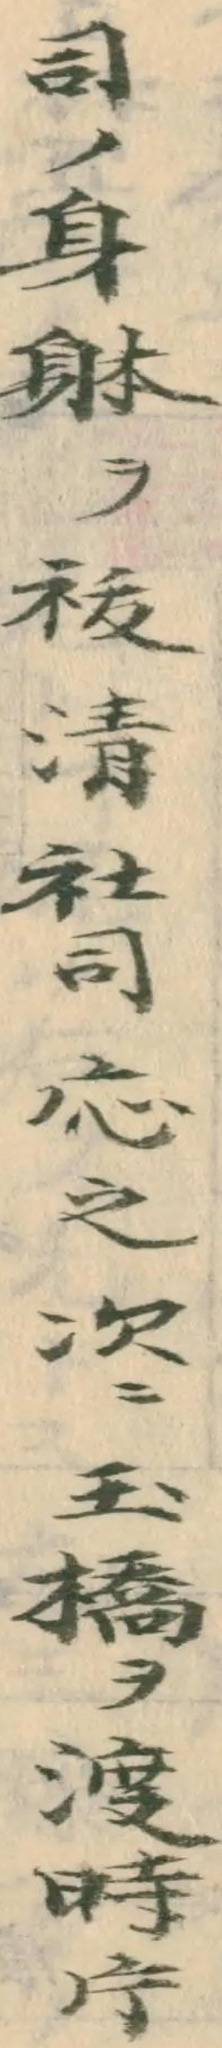司ノ身体ヲ祓清社司応之次ニ玉橋ヲ渡時片
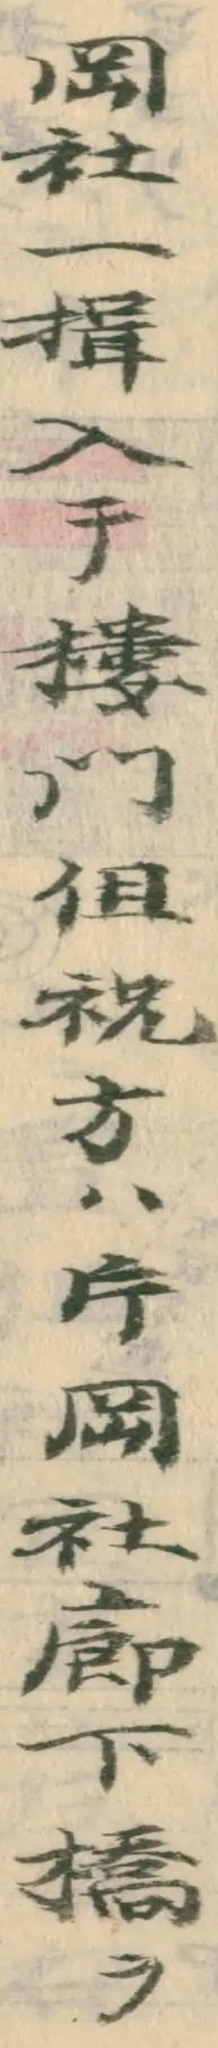岡社一揖入于桜門但祝方ハ片岡社廊下橋ヲ
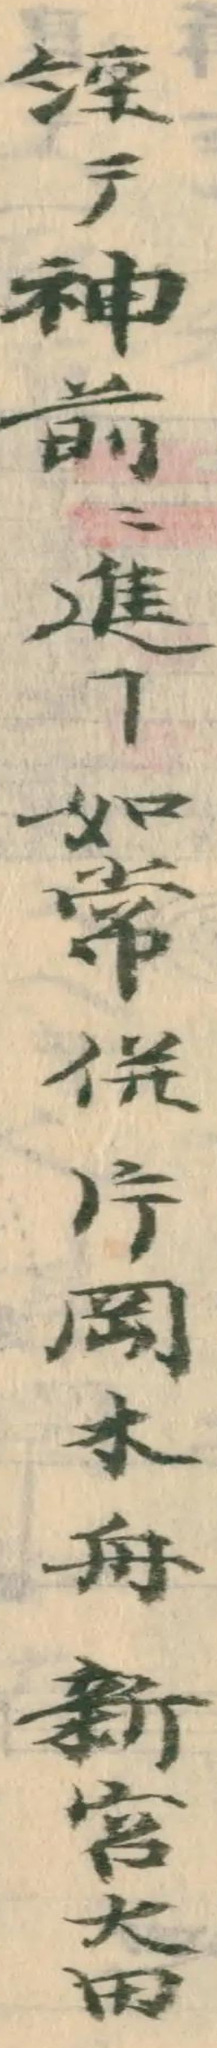経テ神前ニ進コト如常併片岡木舟新宮大田
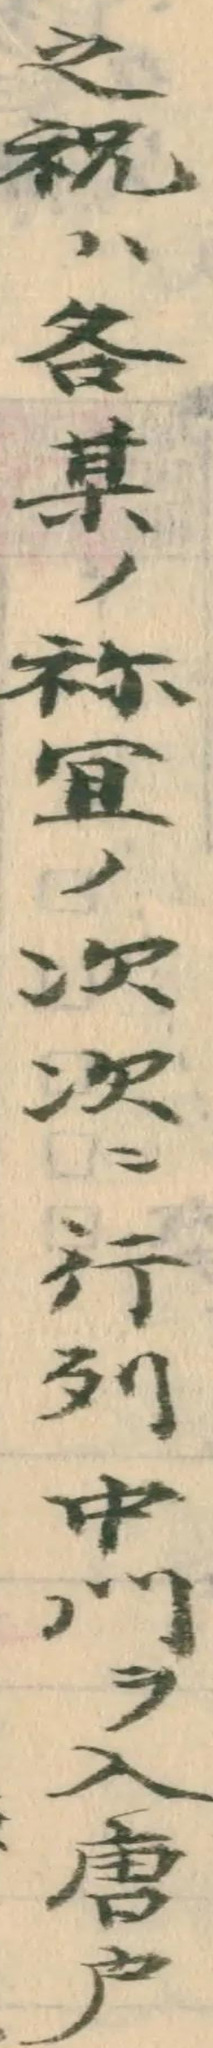之祝ハ各某ノ禰宜ノ次次ニ行列中門ヲ入唐戸
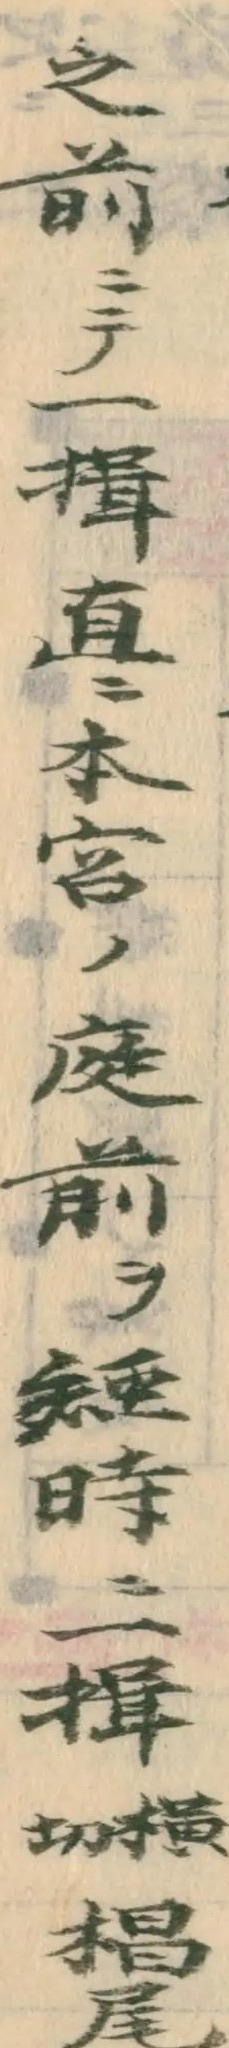之前ニテ一揖直ニ本宮ノ庭前ヲ経時ニ一揖横切椙尾
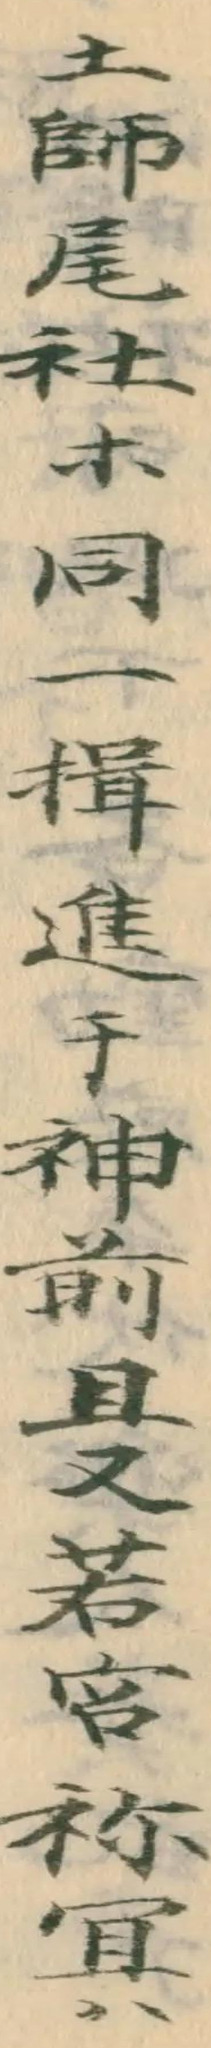土師尾社等同一揖進于神前且又若宮禰宜ハ
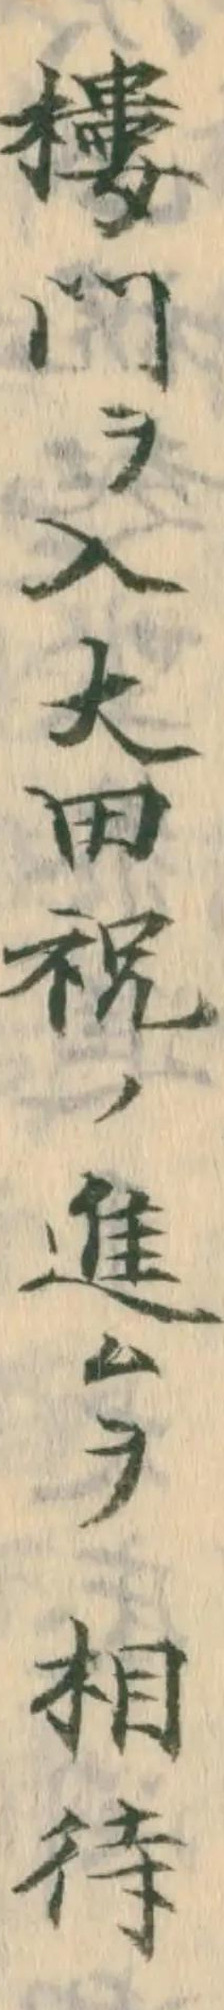桜門ヲ入大田祝ノ進ムヲ相待
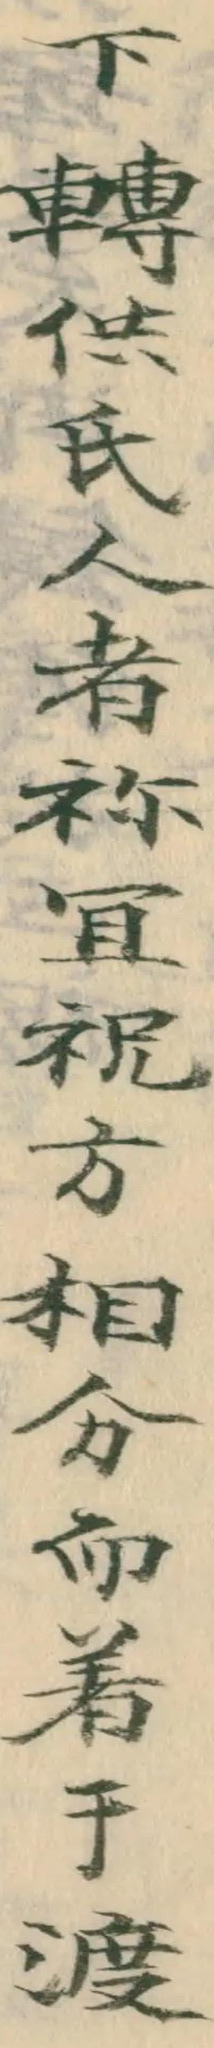下転供氏人者禰宜祝方相分而着于渡
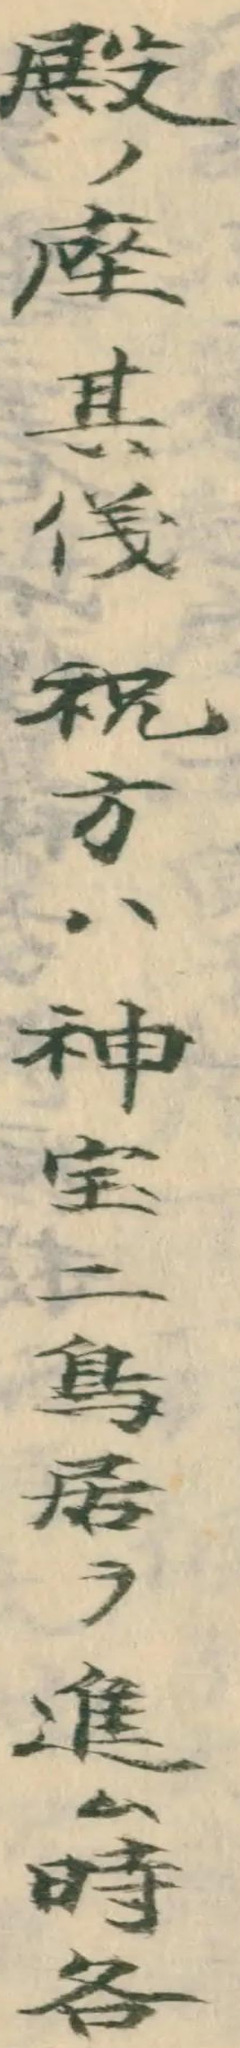殿ノ座其儀祝方ハ神宝二鳥居ヲ進ム時各
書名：賀茂社記録. 第5冊
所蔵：国立国会図書館 National Diet Library, JAPAN
